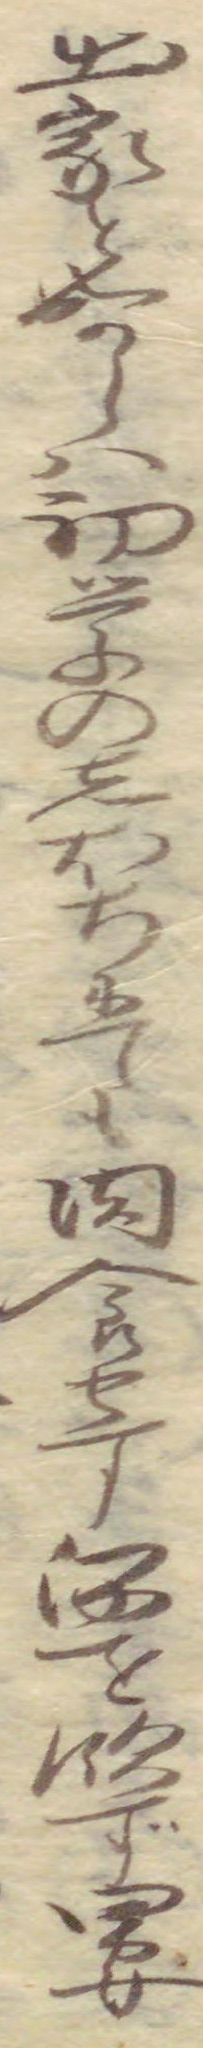出家と成からは初学のしほちにても肉食せす酒を飲ず男女
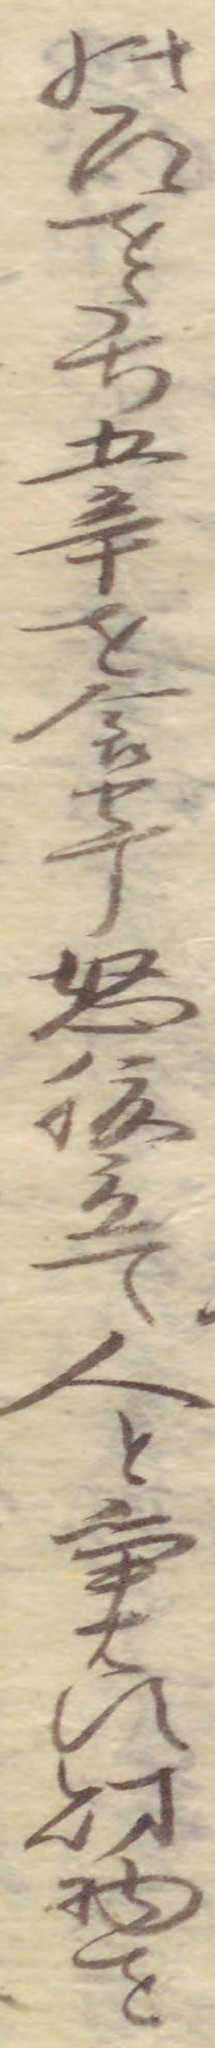の道をたち五辛を食せす怒腹立て人と争はす財物を
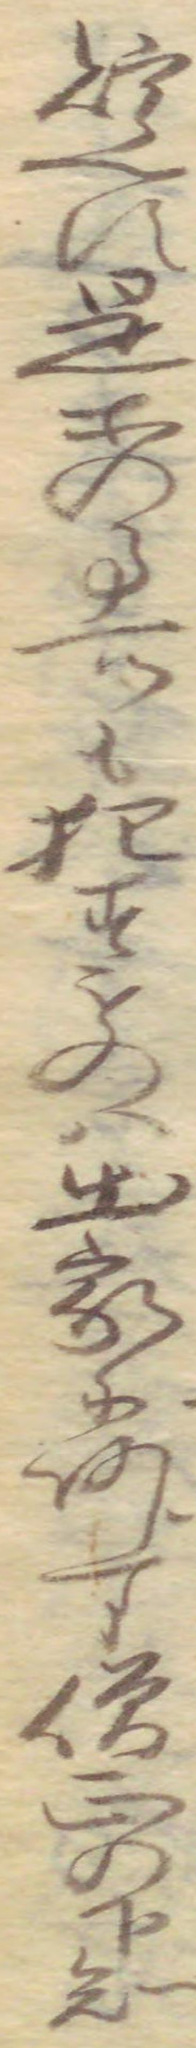貯へす是等の事一ツも犯すものは出家にあらす僧正の下知

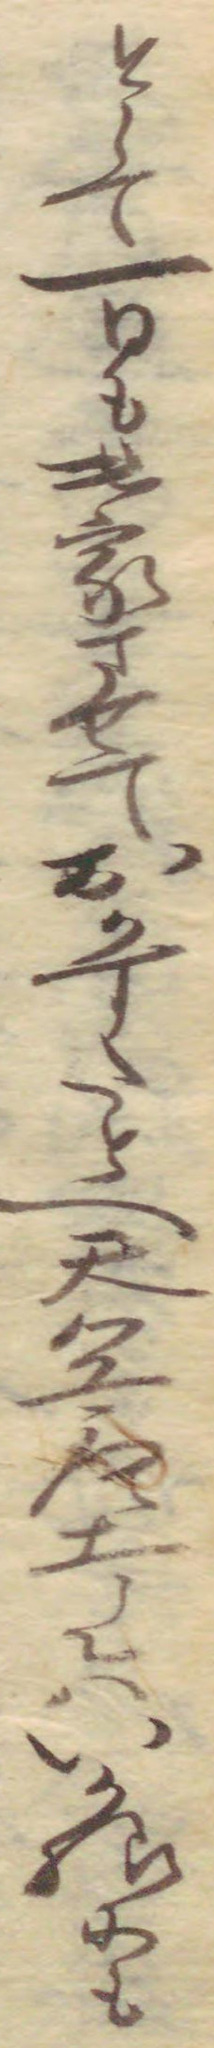として一日も出家させておかすたとへ天竺唐土ニてはいか様にも
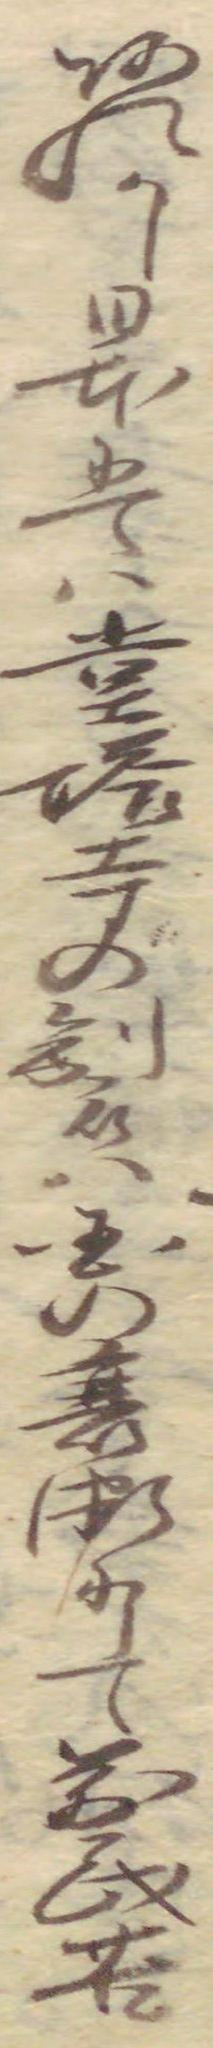あれかし日本にては堂塔寺の製は国の衰微にして万民苦
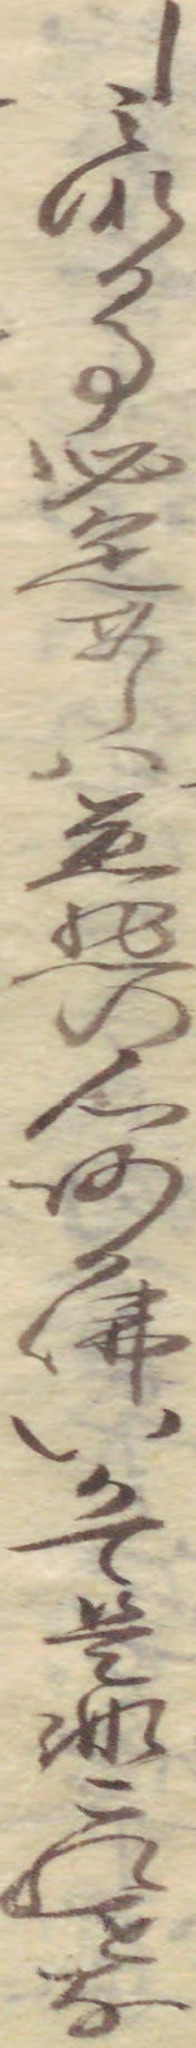しみなる事必定ならは慈悲の心ある仏いかて是非これをな
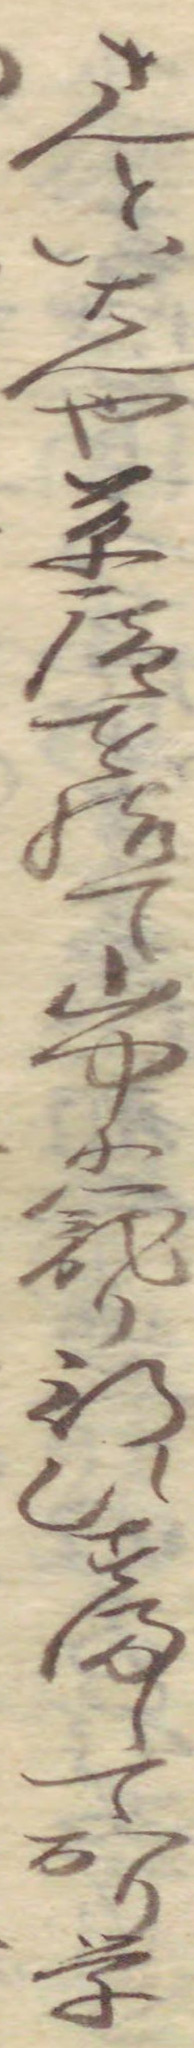さんといはんや草庵を結て山中に籠り行ひすましており学
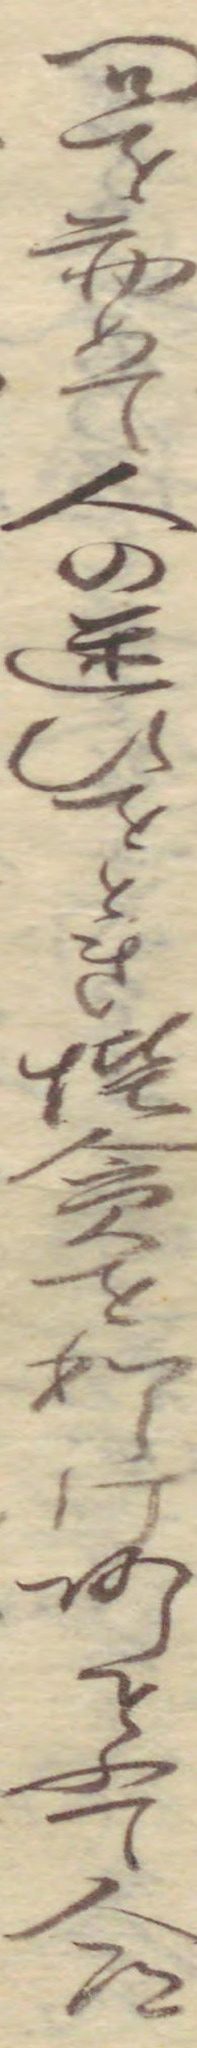問を勤めて人の迷ひをとき慳貪を和らけあらそふて人道
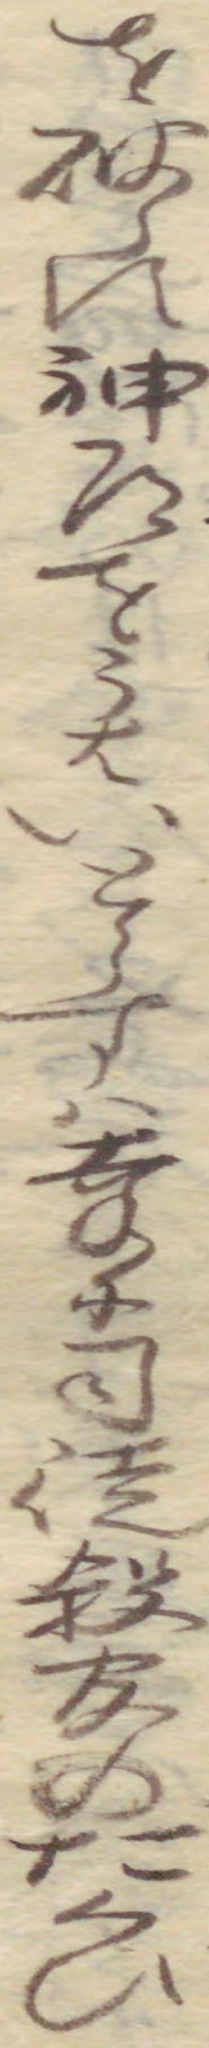を破らす神道をうはいとらすは幸に司徒殺官のたくい
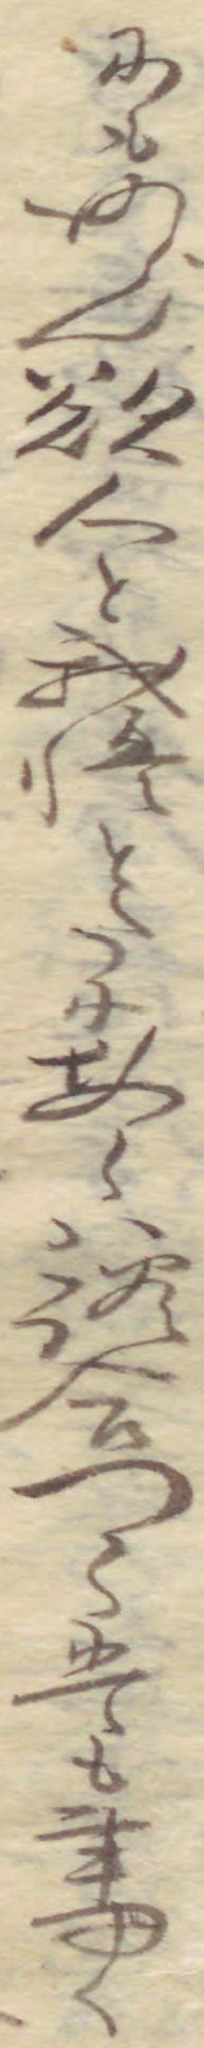にもあらん欲心と我侭とたにならは談合つくにても事ゆく
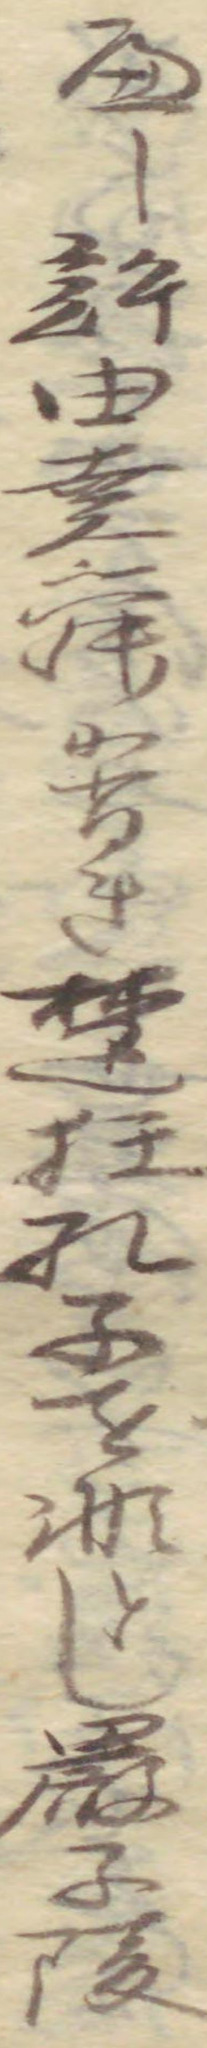へし許由堯舜に背き楚狂孔子を非とし巌子陵
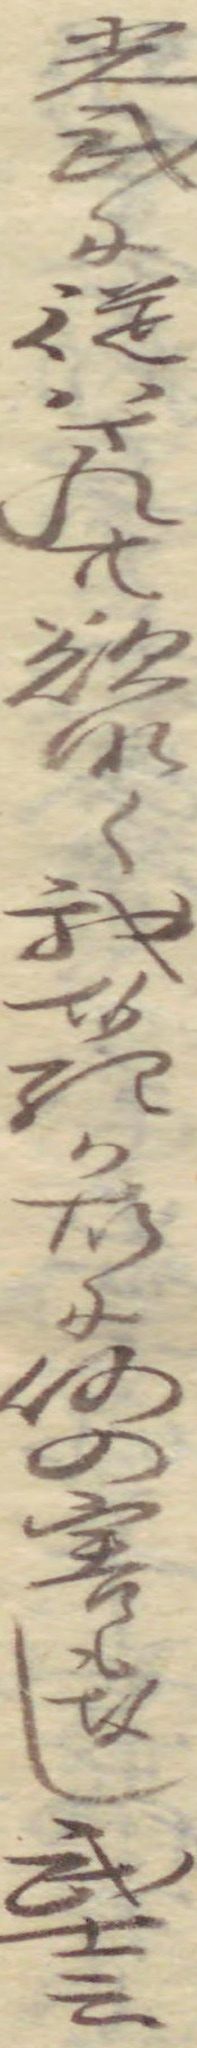光武に従わされ共欲なく我なきか故に何の害もなし武士云
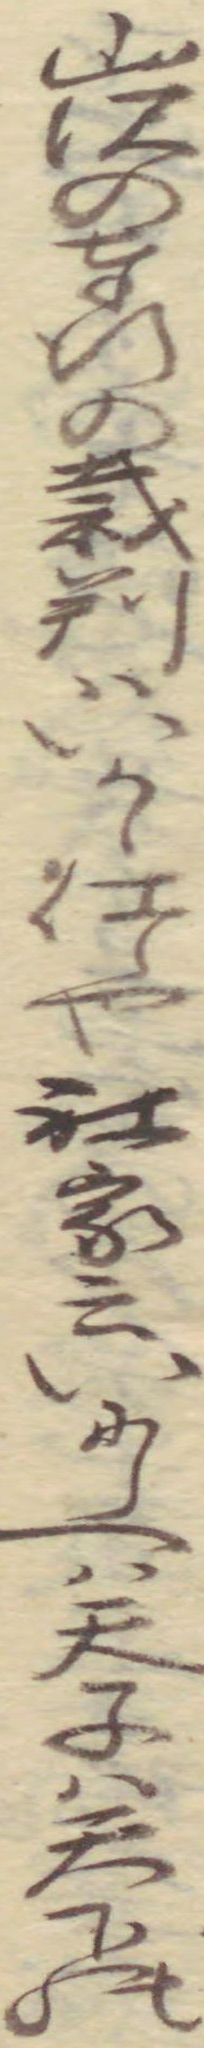山沢の奉行の裁判はいかゝ仕候や社家云いにしへは天子は天下の
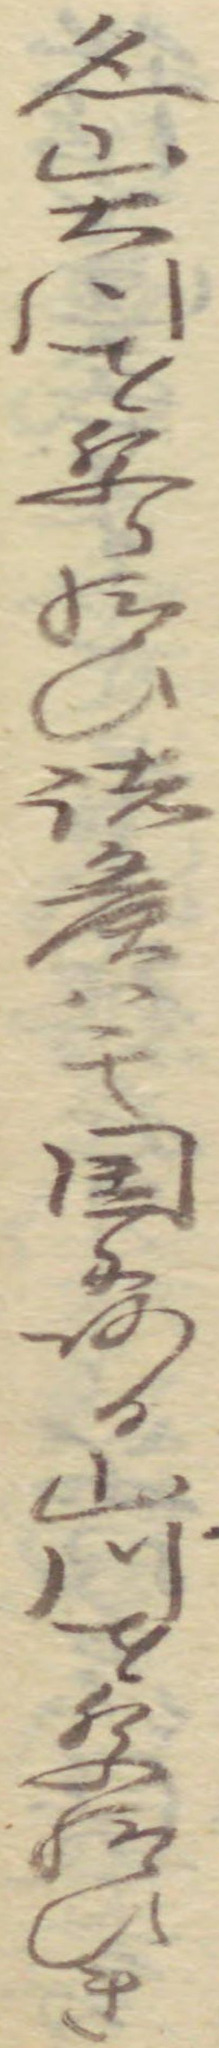名山大川を祭り給ひ諸侯は其国にある山川を祭給ひき
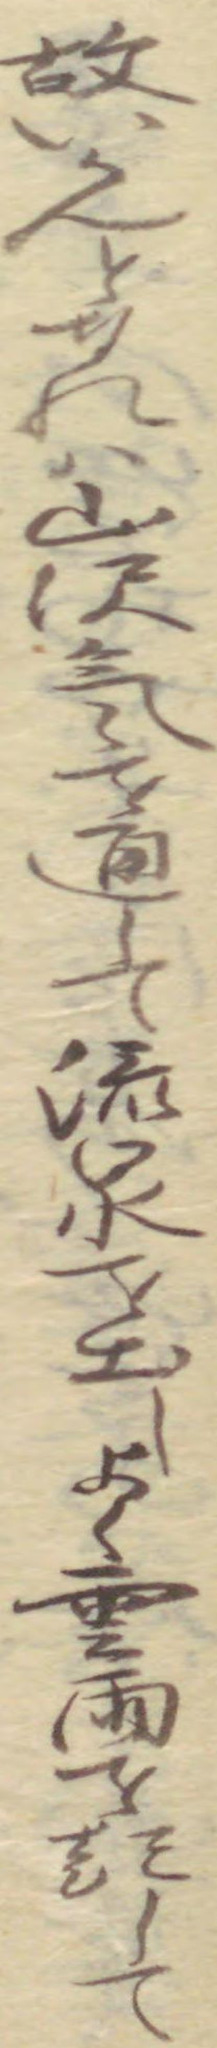故いかんとなれは山沢気を通して流泉を出し欲雲雨を起して
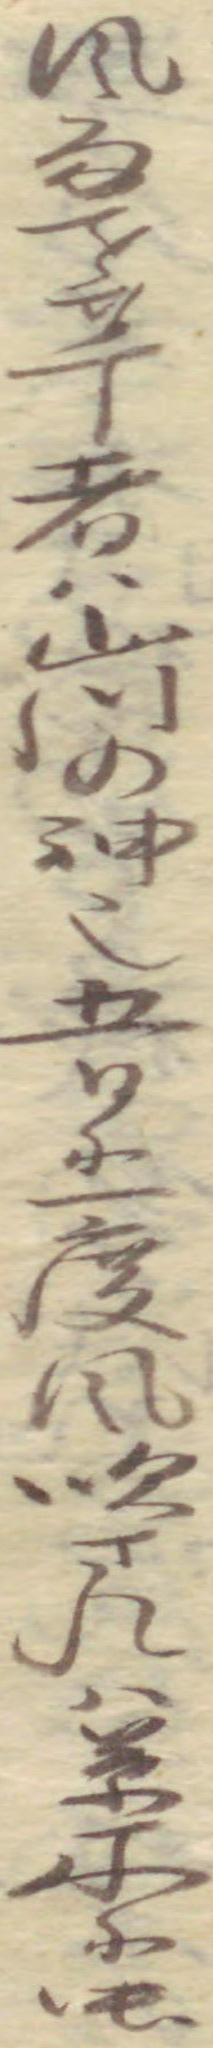風雨をなす者は山川の神也五日に一度風吹されは草木に虫
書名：鶯宿雑記. 巻263-264
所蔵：国立国会図書館 National Diet Library, JAPAN
